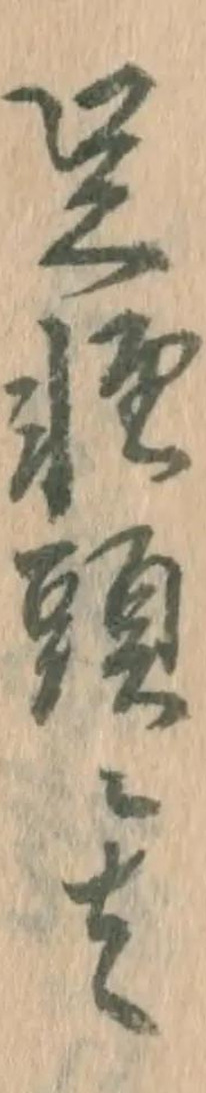足軽頭に者
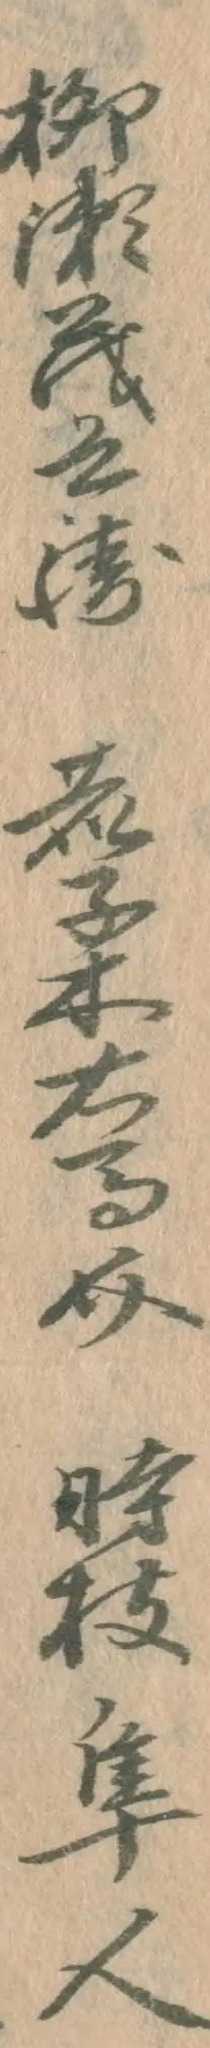柳瀬茂兵衛花子木右馬介時枝隼人
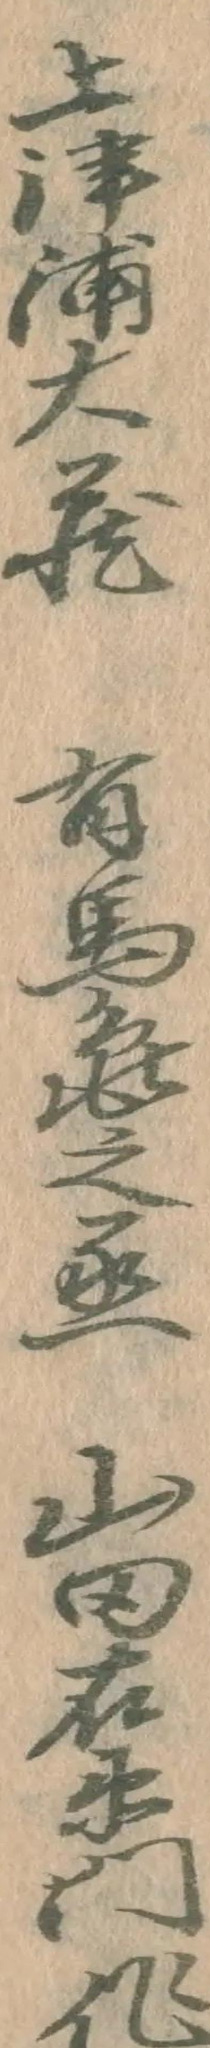上津浦大蔵有馬亀之丞山田右衛門作
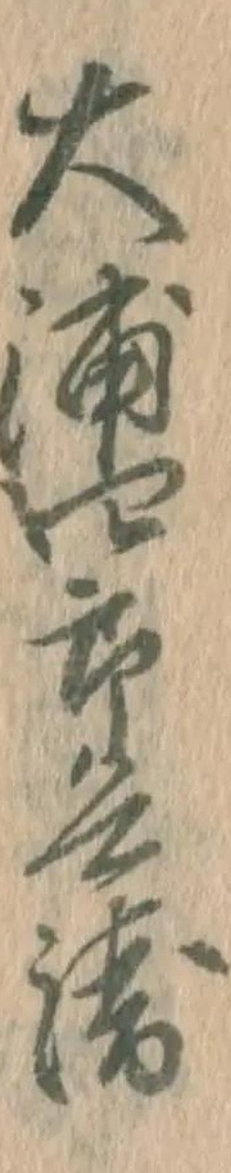大浦四郎兵衛
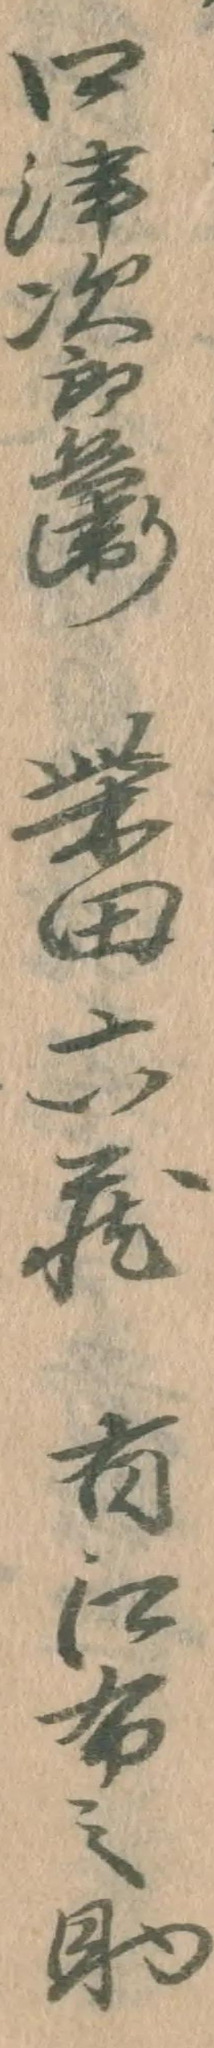口津次郎兵衛柴田六蔵有江右之助
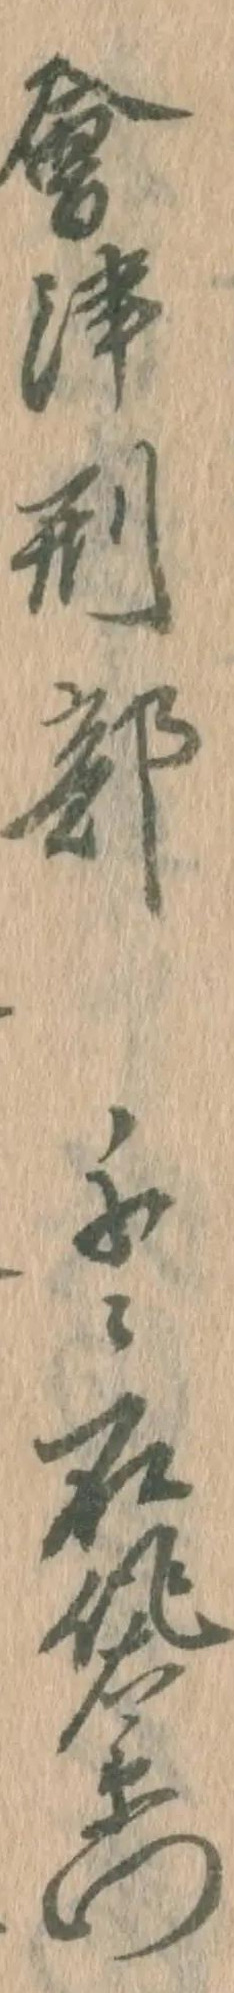会津刑部千々石作右衛門
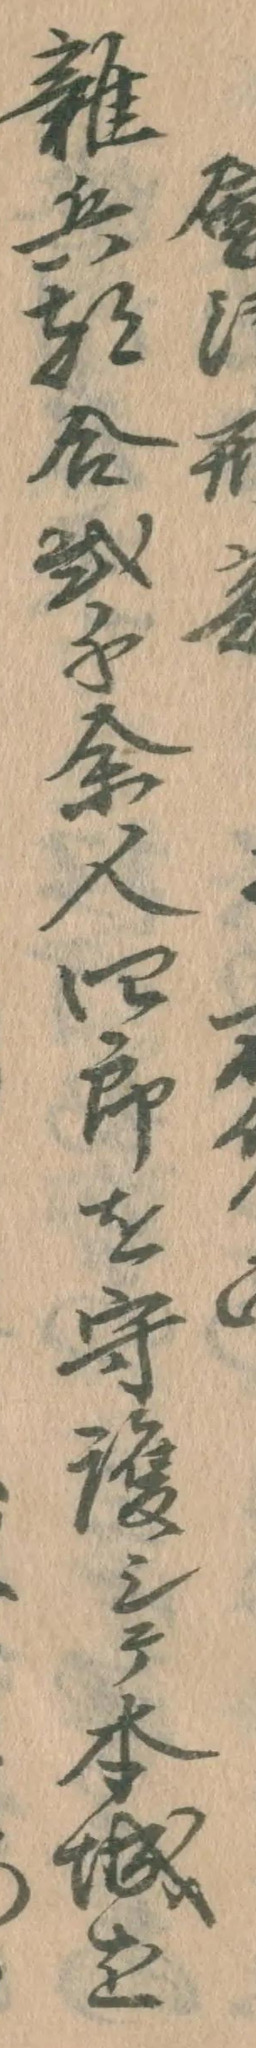雑兵都合弐千余人四郎を守護して本城を
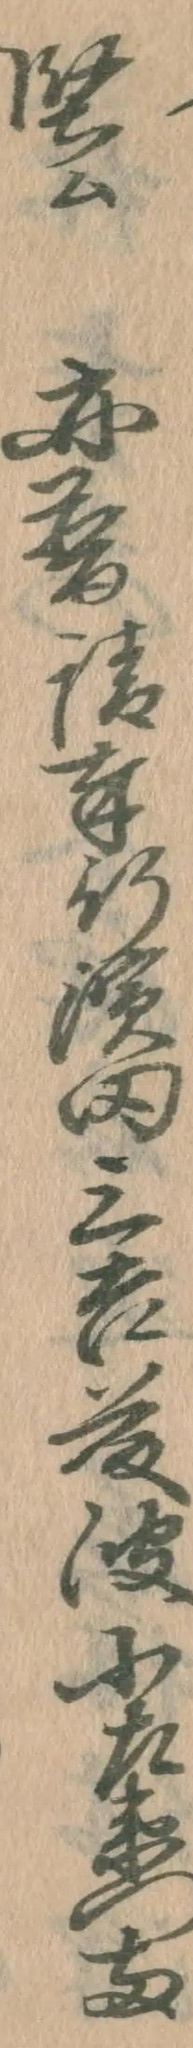堅む亦普請奉行浜田三吉藤波子左衛門両
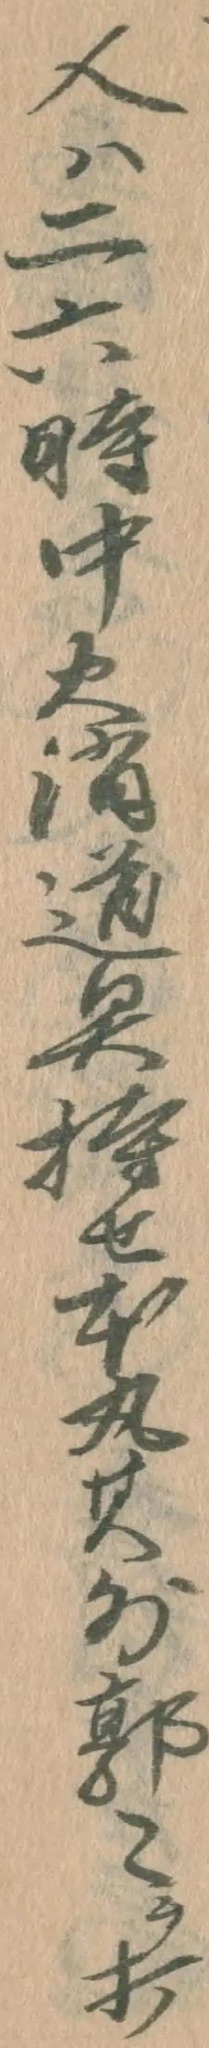人は二六時中火消道具持せ本丸其外郭々を打
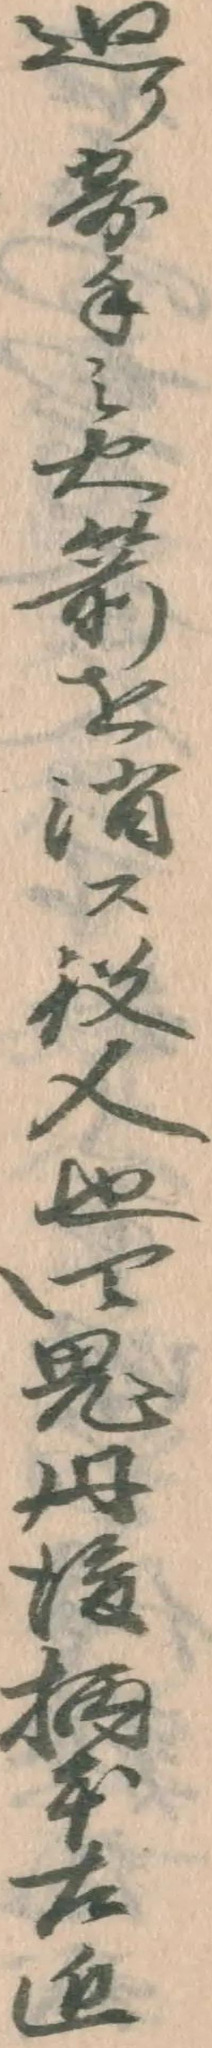廻り寄手之火箭を消す役人也四鬼丹後栖本左近
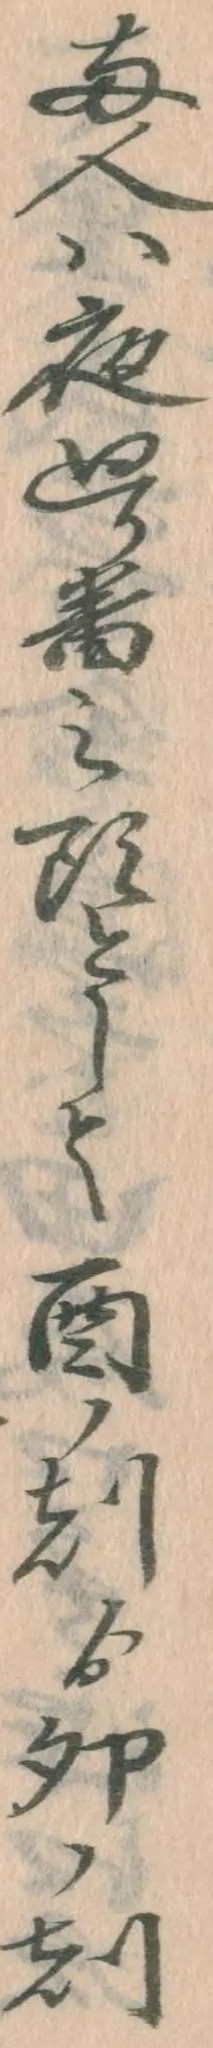両人は夜廻り番之頭として酉之刻ゟ夘之刻
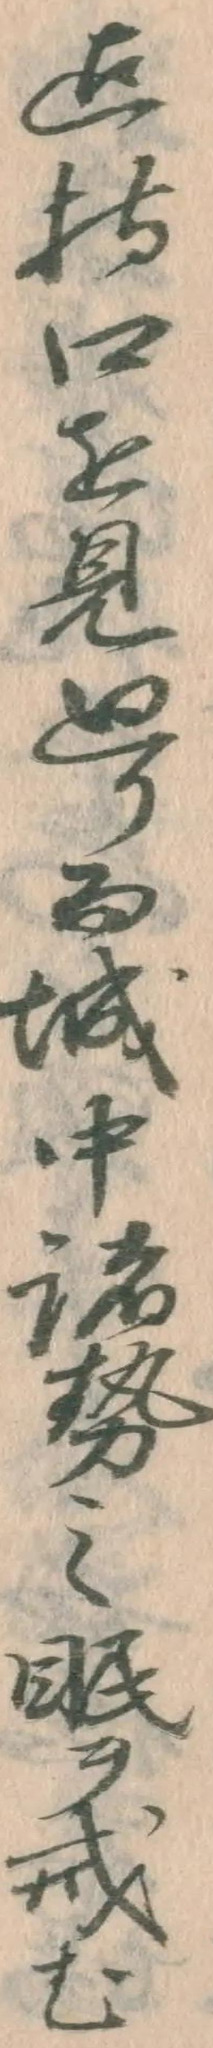迄持口を見廻り而城中諸勢之眠を戒む
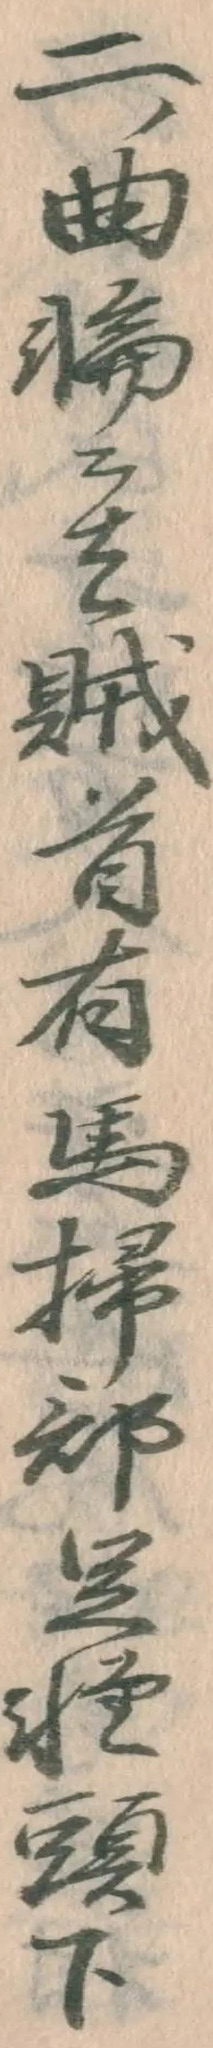二之曲輪に者賊首有馬掃部足軽頭下
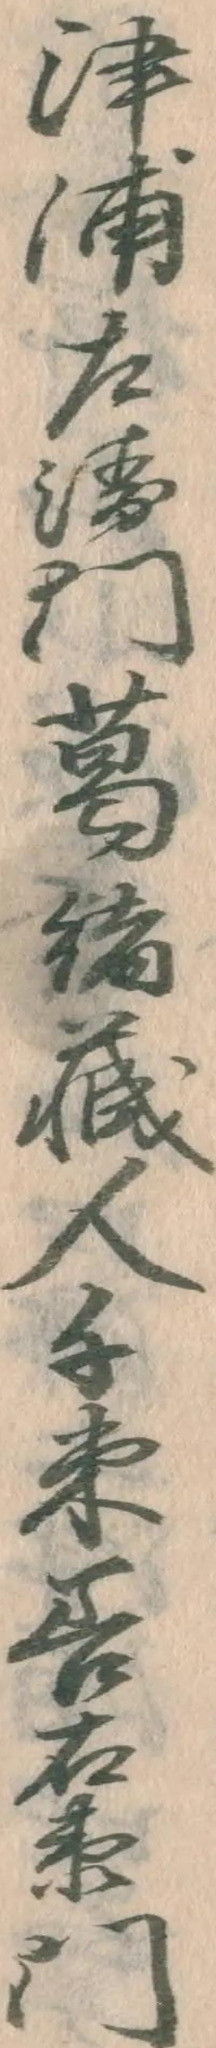津浦左衛門勝占葛緒蔵人千束善右衛門
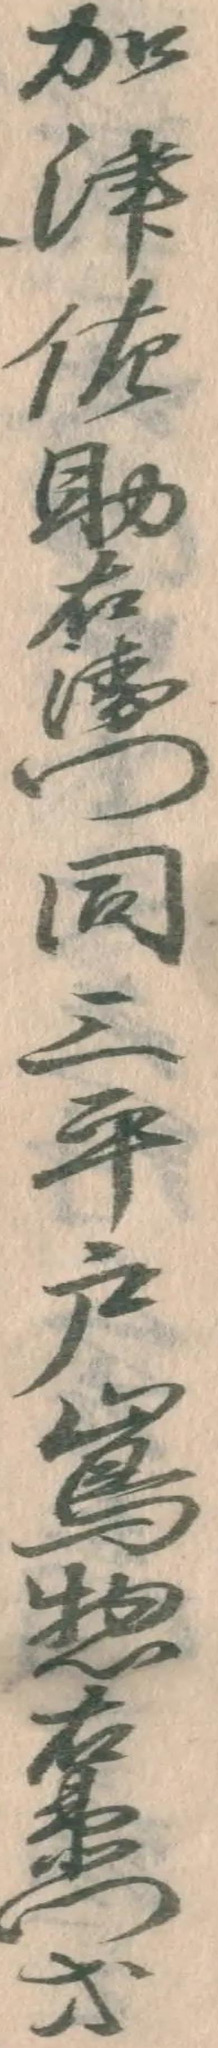加津佐助右衛門同三平戸島惣右衛門等
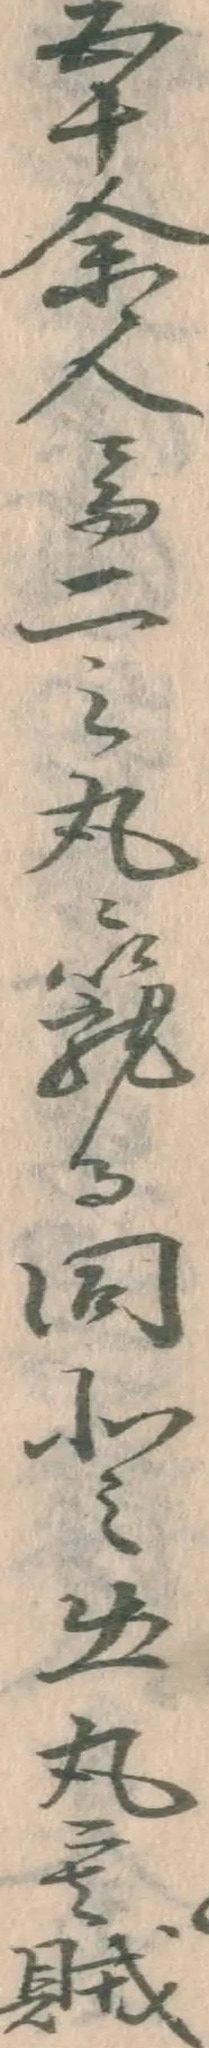五十余人に而二之丸に籠る同北之出丸に者賊
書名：切支丹御退治記 49巻. [4]
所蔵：国立国会図書館 National Diet Library, JAPAN
